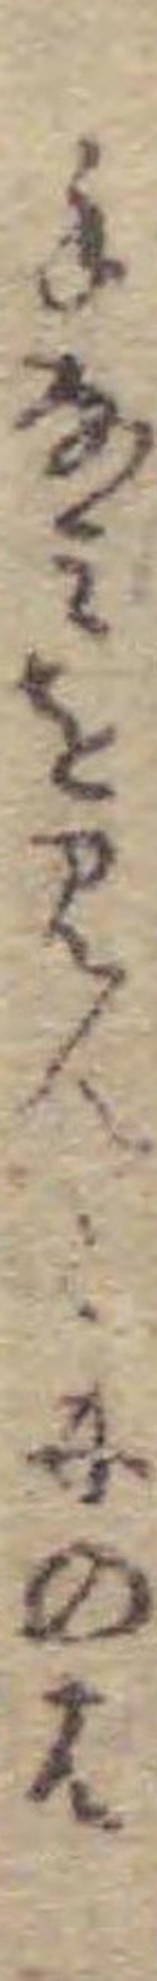手なみを見んと木のは
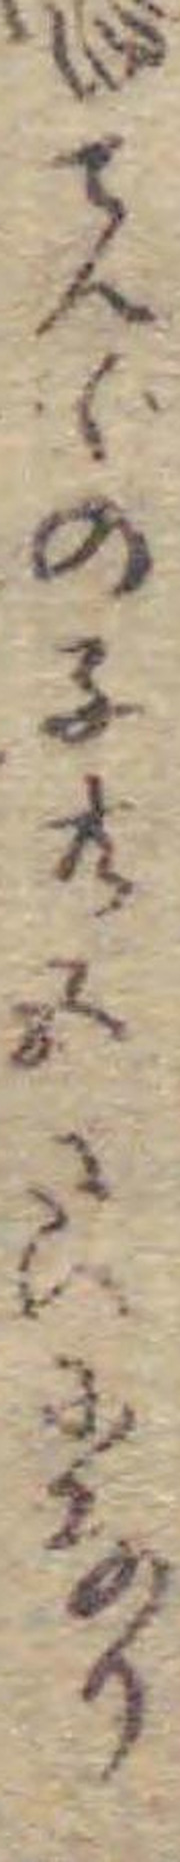てんぐの子共五さいになり
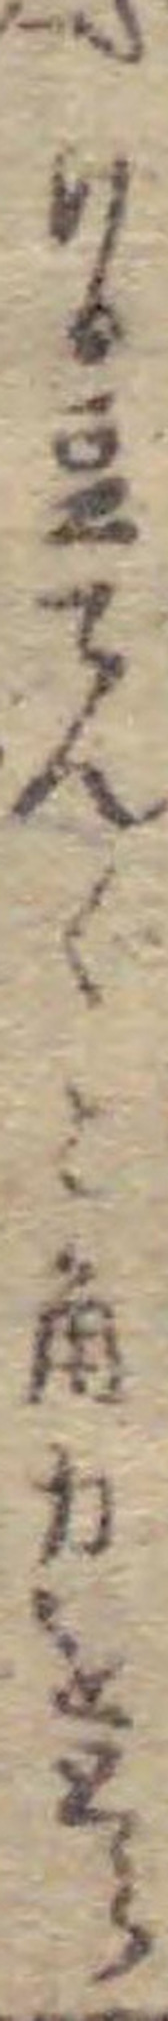ける豆てんぐと角力をとら
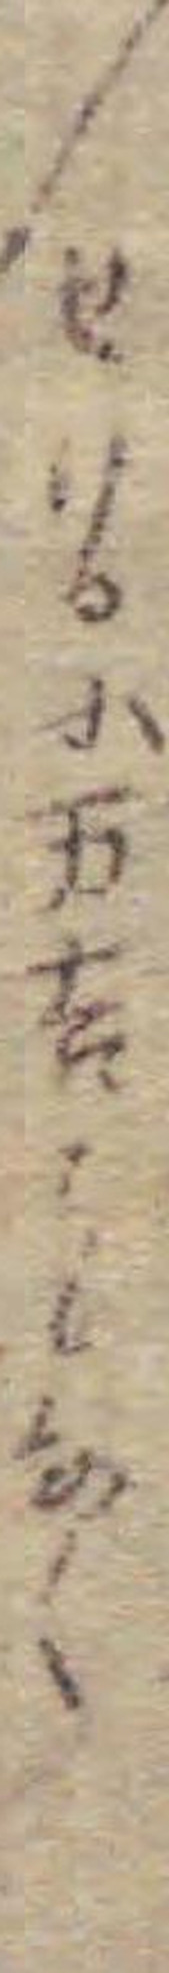せけるに万吉てもなく
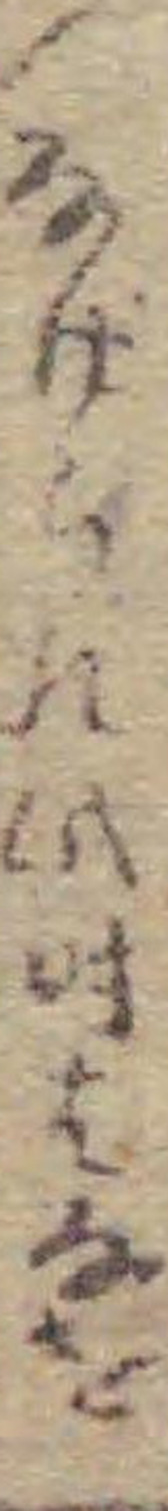なげられ此時はなを
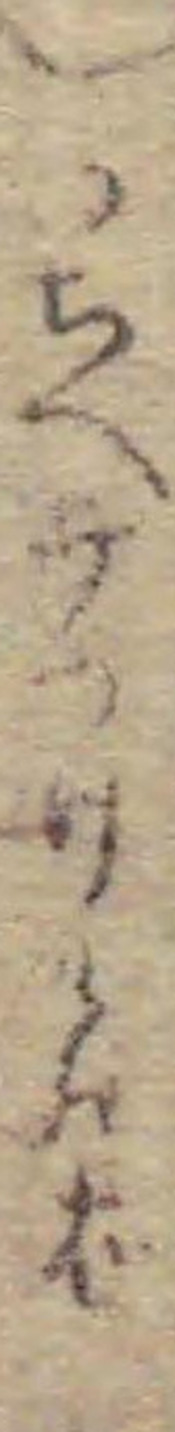つちへ打ちつけければ
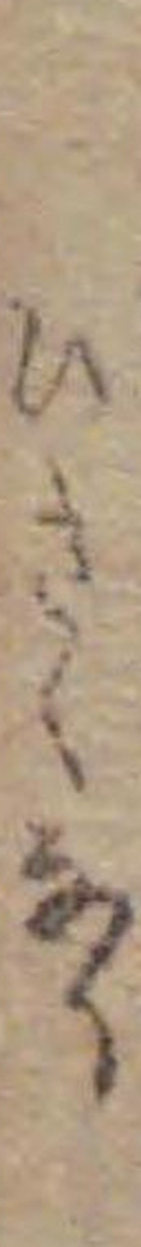ひきくなり
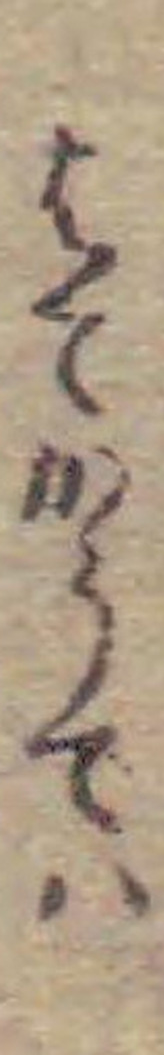はてかうては
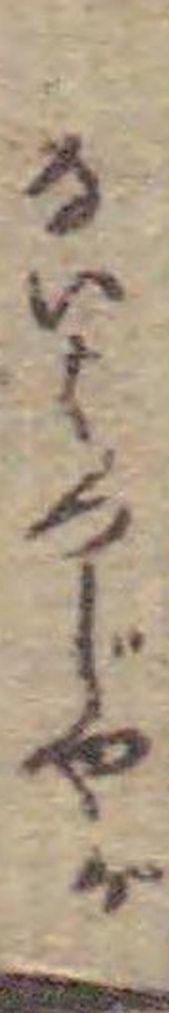ないはつじやが
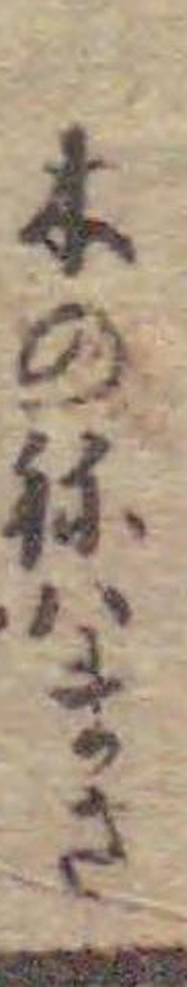木のねはまさ
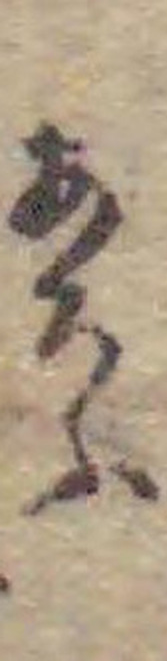あろふ
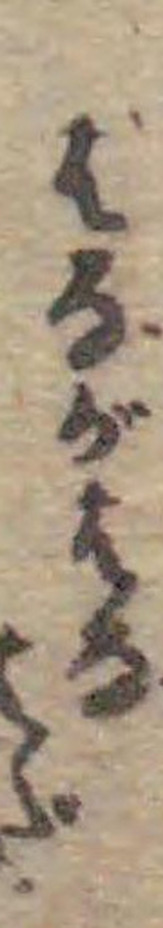はながはな
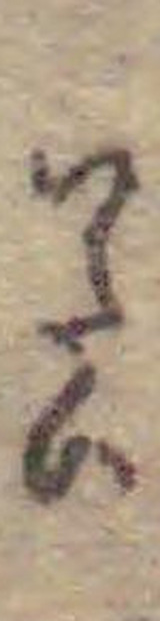いたい
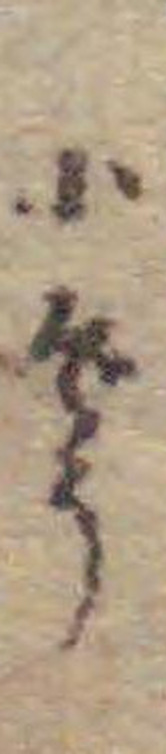小ぞう
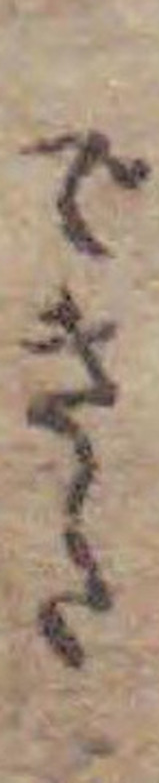できた

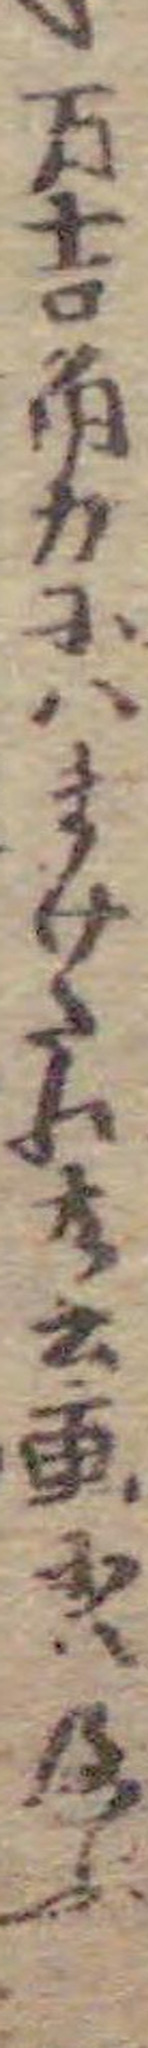万吉角力にはまけたれ共書画には及ぶ
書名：鼻峰高慢男 : 2巻
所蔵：国立国会図書館 National Diet Library, JAPAN
